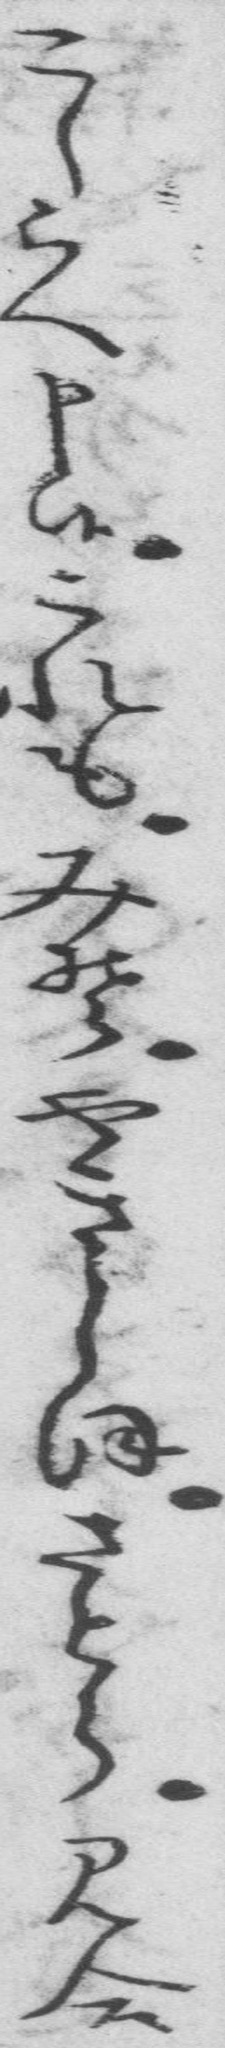こしらへ申候。これも。みそ。やきしほ。さとう。見合
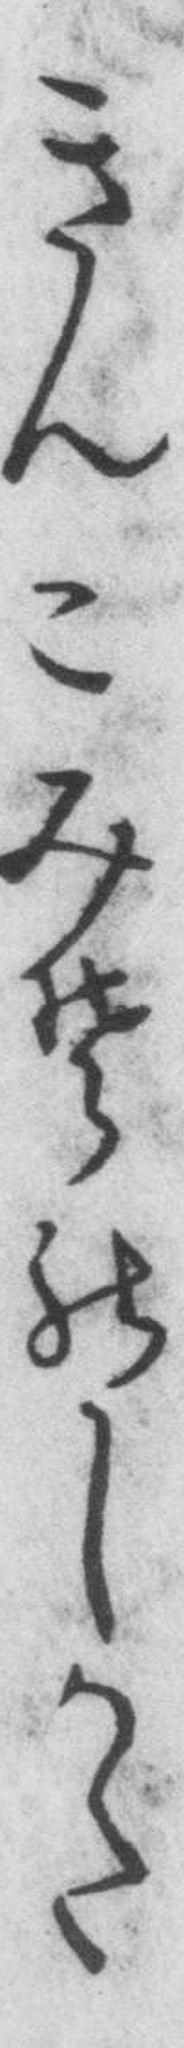きんこみそのしかた

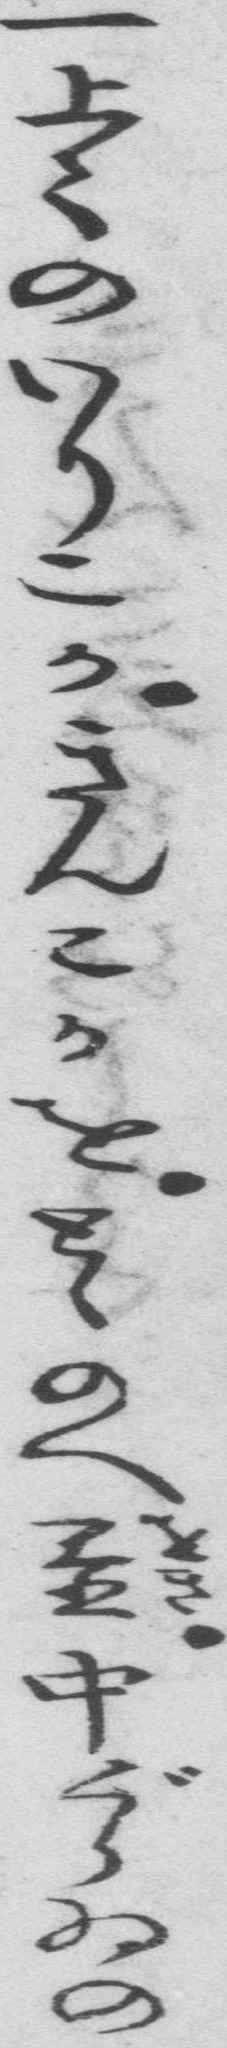一上々のいりこか。きんこかを。とゝのへ置。中ぐらゐの
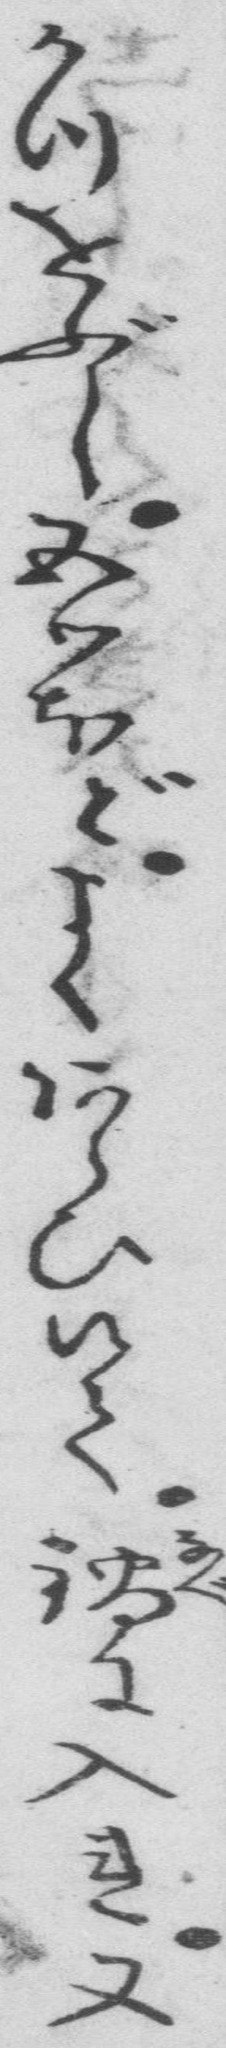かつをぶし。五ツほど。よくあらひ候て。鍋に入れ。又
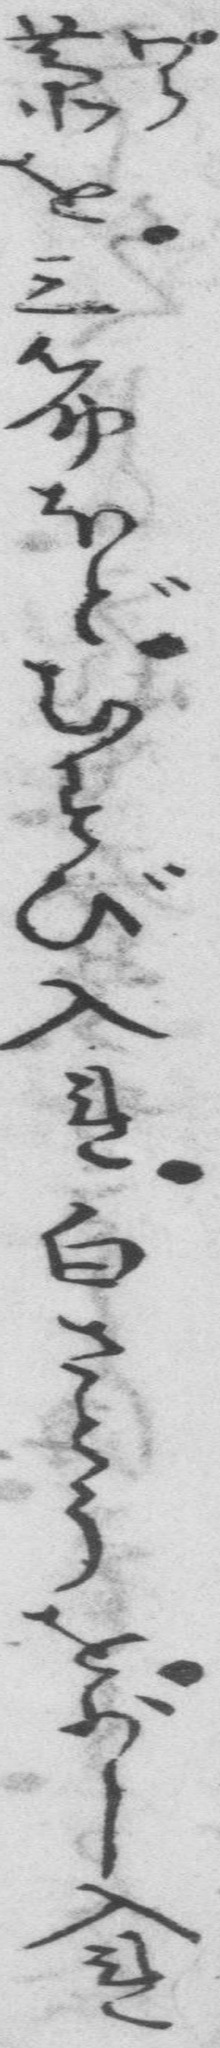藁を。三筋ほど。むすび入れ。白さとうを。少し入れ
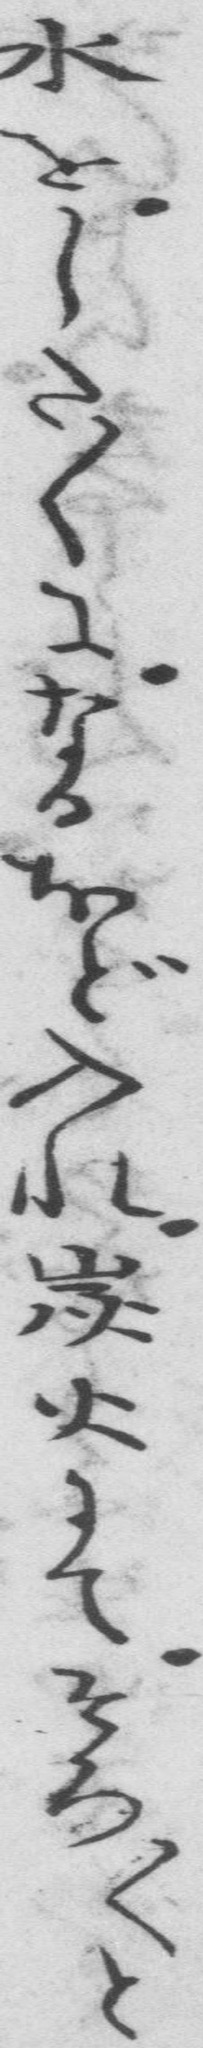水を。した〳〵に。なるほど入れ。炭火にて。そろ〳〵と
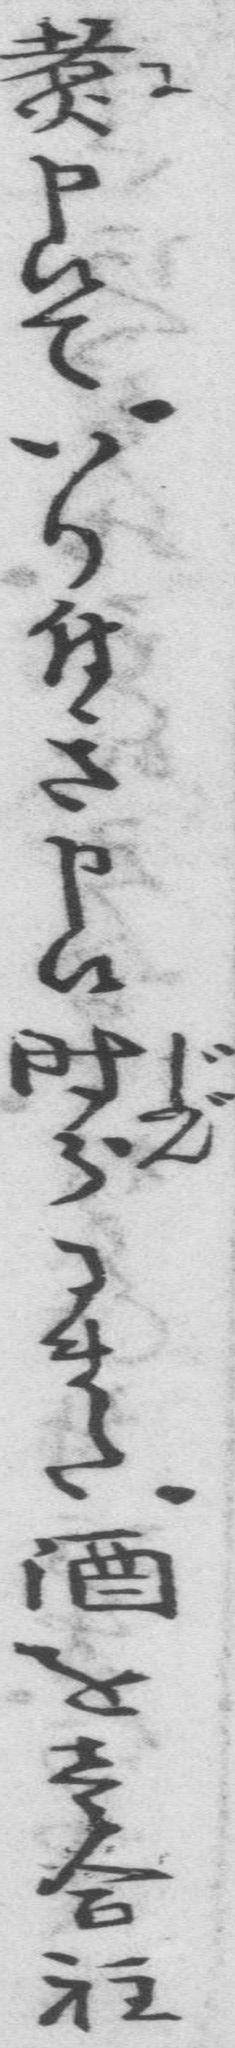煮申候て。いり付き申候時分にまた。酒を壱合程
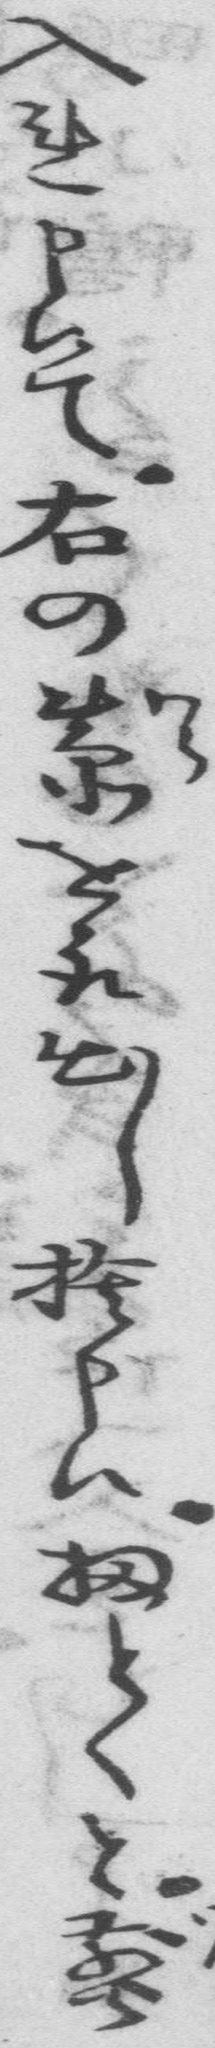入れ申候て。右の藁を取出し捨申候。扨とくと。煮
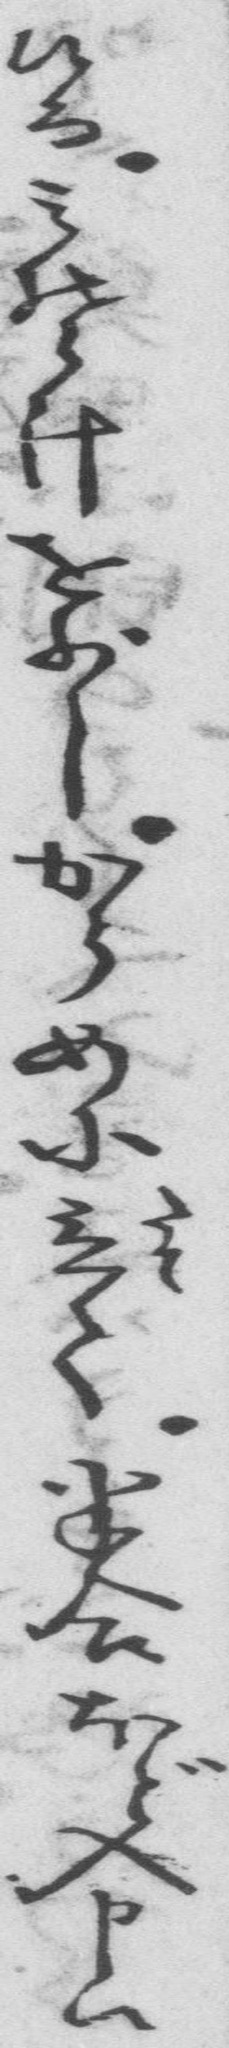候而。みそ汁を少し。からめに立て。半合ほど入申候
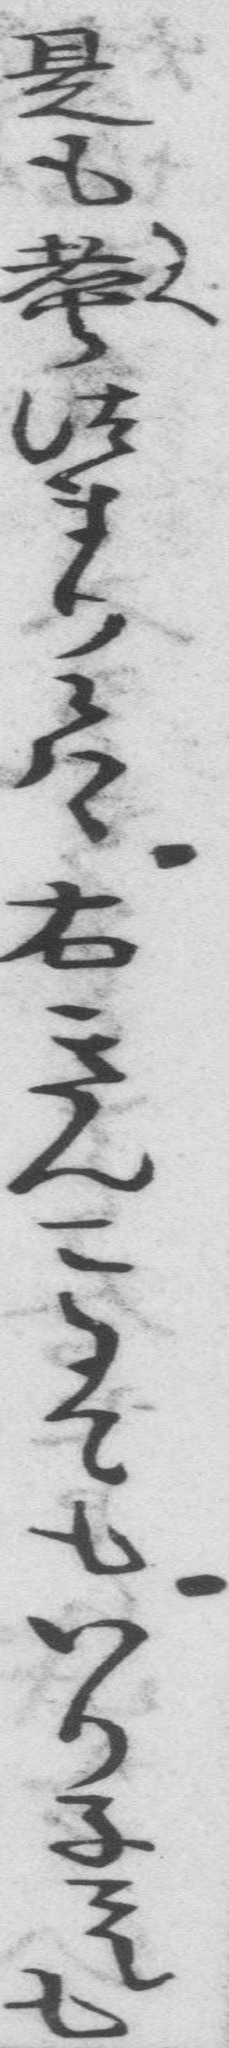是も煮つまり候はゝ。右きんこにても。いり子にても
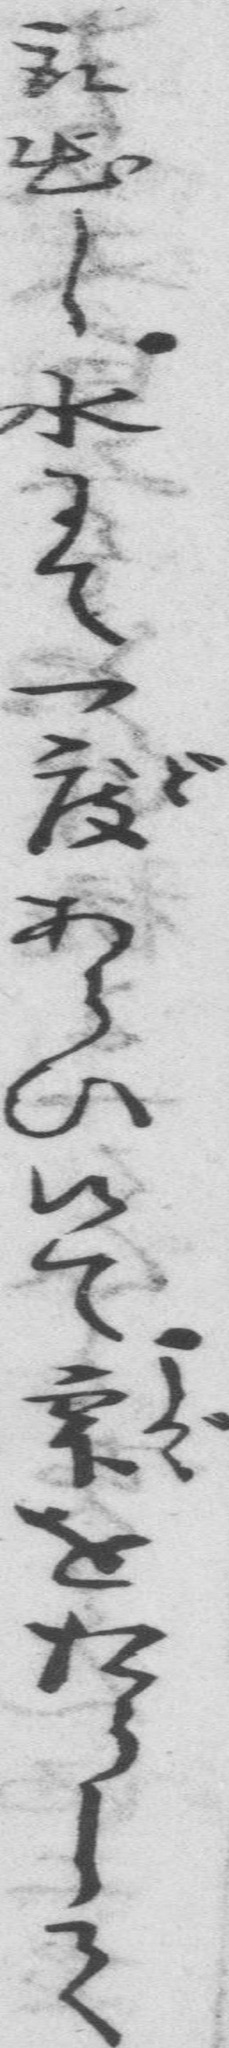取出し。水にて一度あらひ候て。雫をたらして
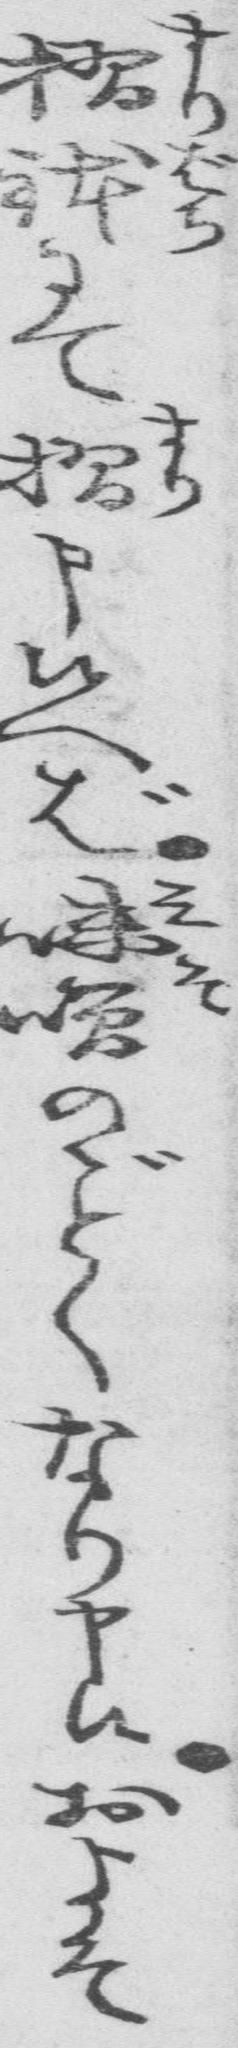摺鉢にて摺申候へば。味噌のごとくなり申候。およそ
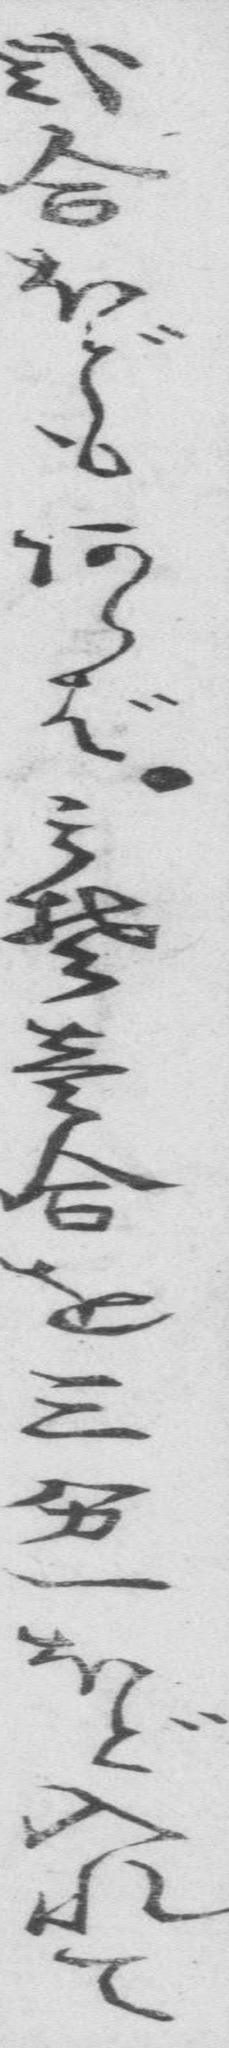弐合ほどもあらば。みそ壱合を三分一ほど入れて
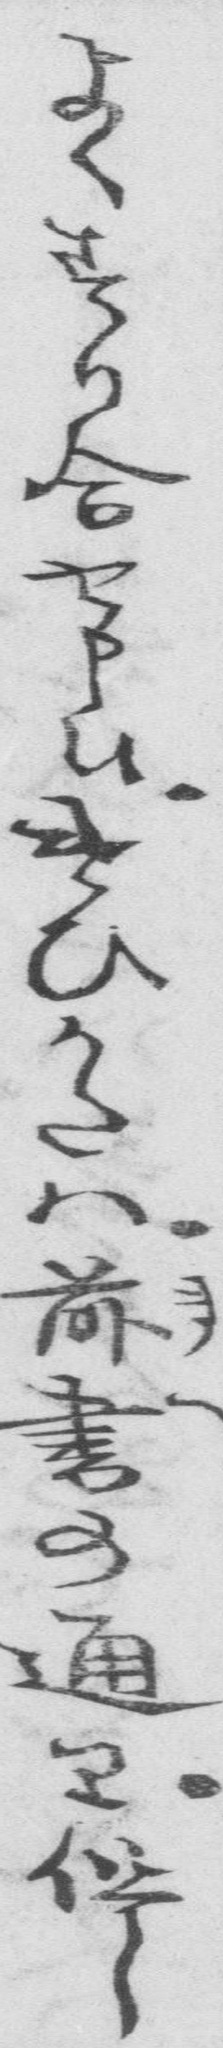よくすり合せ申候。遣ひかたは。前書の通り。但し
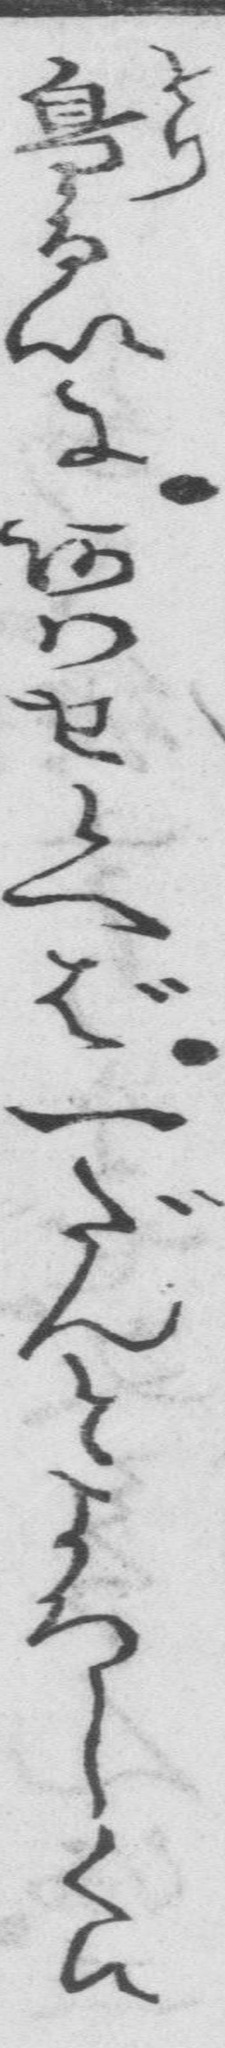鳥るいに。あはせ候へば。一だんとよろしく候
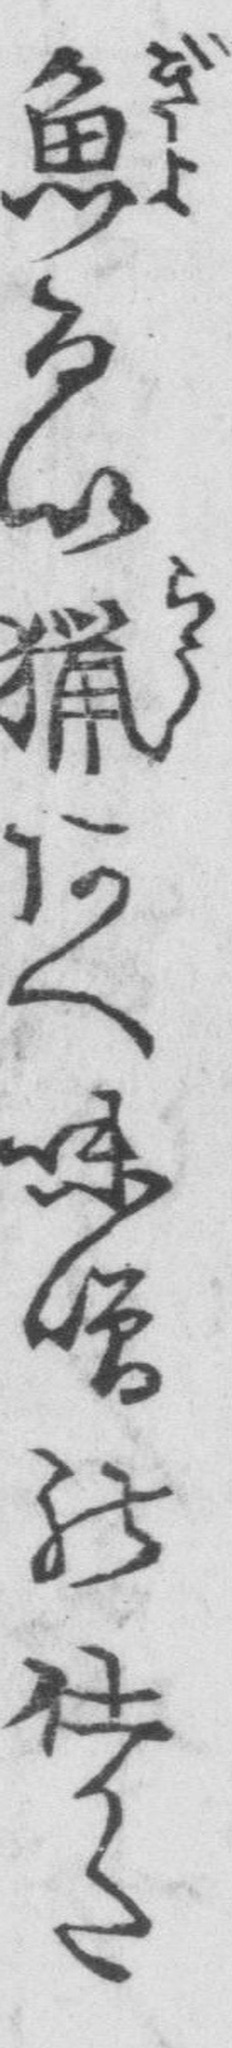魚るい猟あへ味噌の仕かた
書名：萬寳料理秘密箱
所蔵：大阪府立大学学術情報センター 国文学研究資料館
